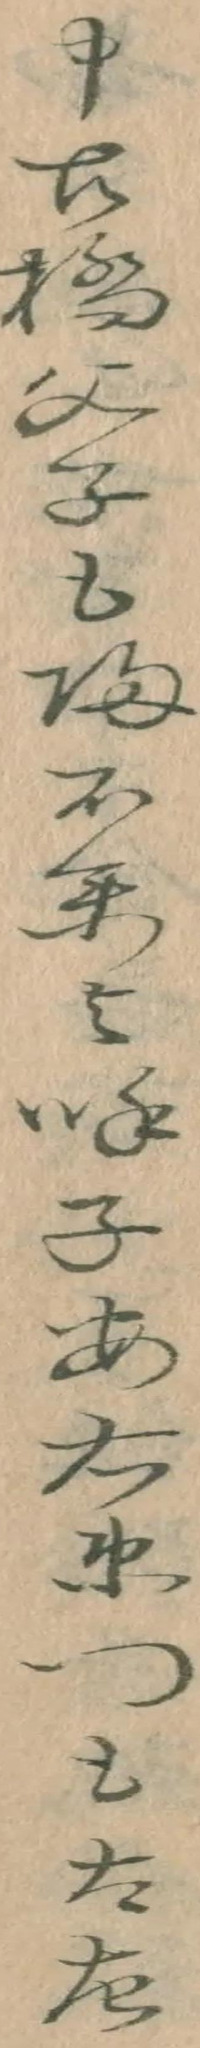申古橋父子も帰不参与呼子安右衛門も太左
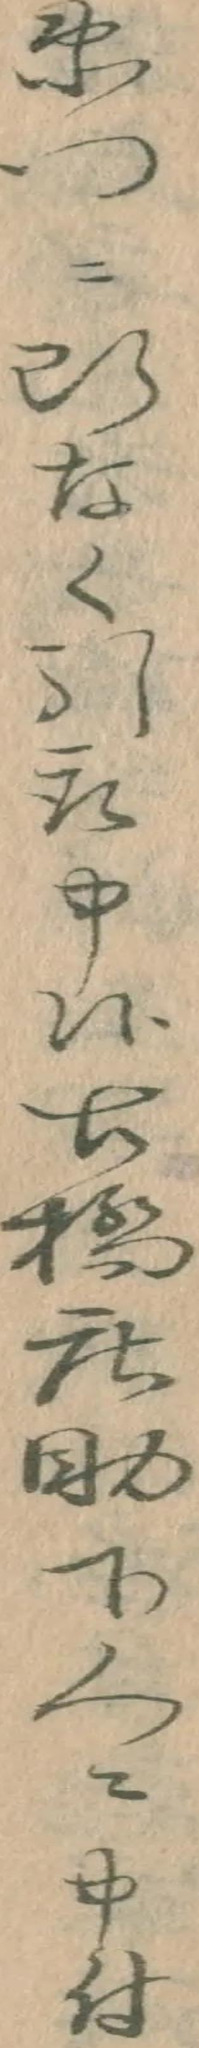衛門に断なく引取申候古橋庄助下人に申付
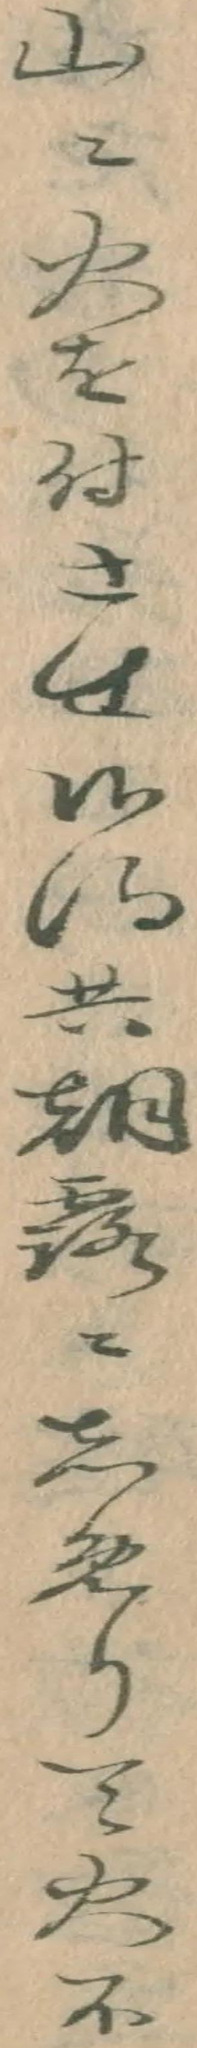山に火を付させ候得共朝露に志免りて火不
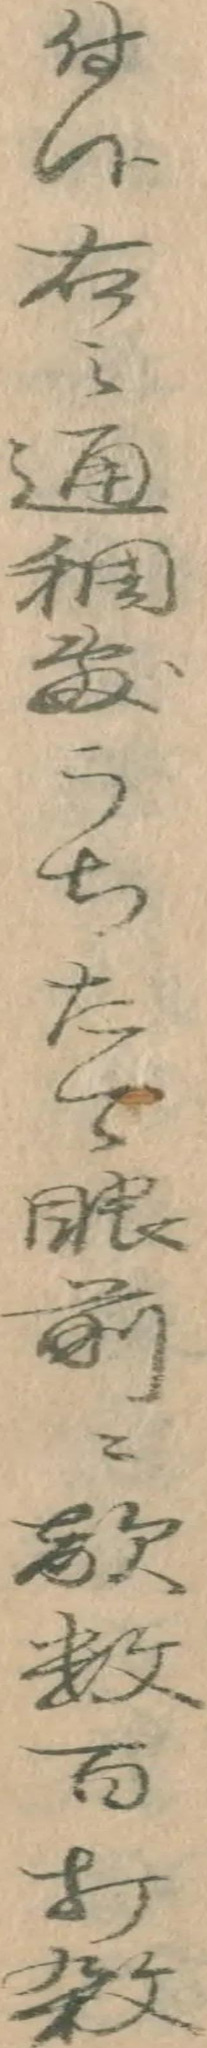付候右之通稠敷うちたて肥前に敵数百打殺
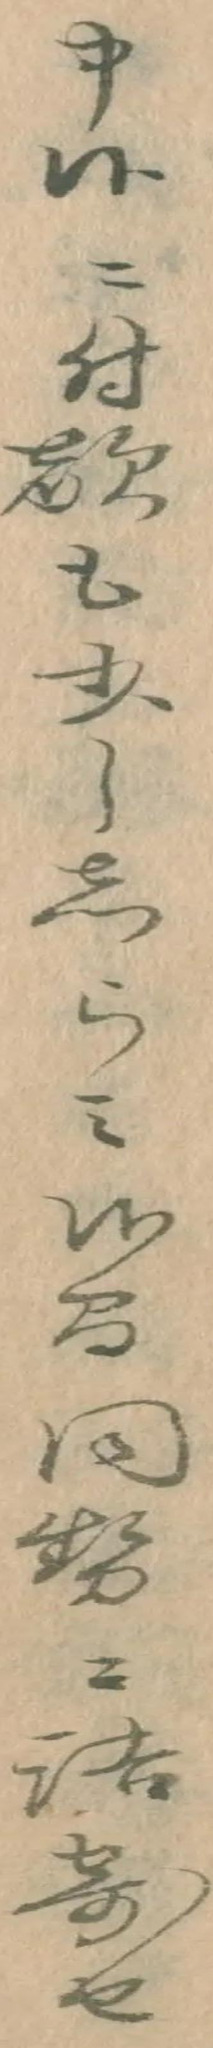申候に付敵も少し志らみ候間同勢に詰寄せ

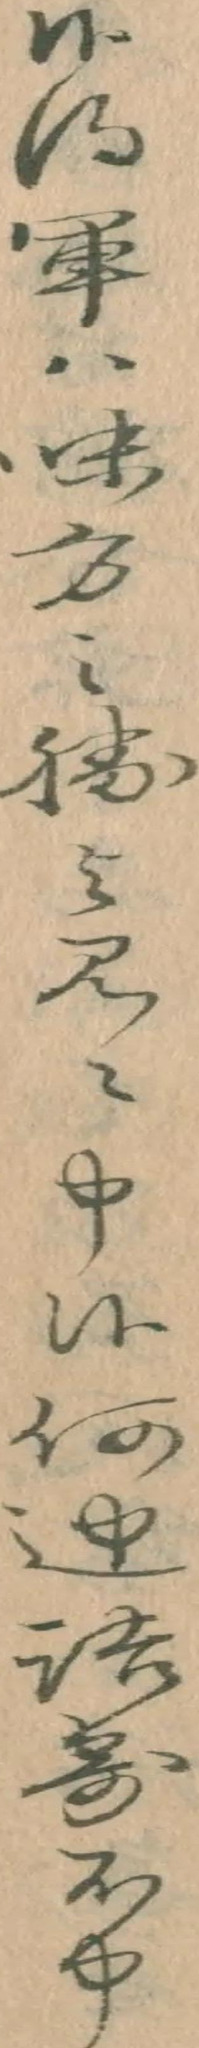候得軍は味方之勝与見に申候何迚詰寄不申
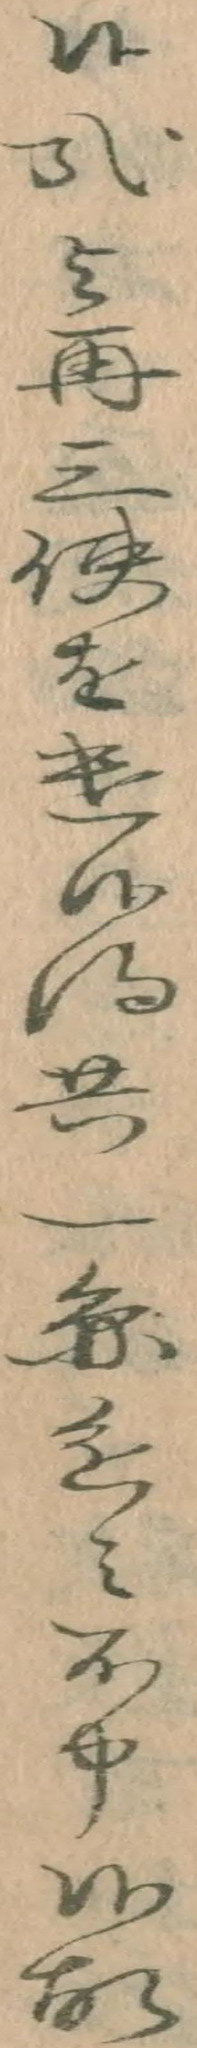候哉与再三使を遣候得共一円進み不申候故
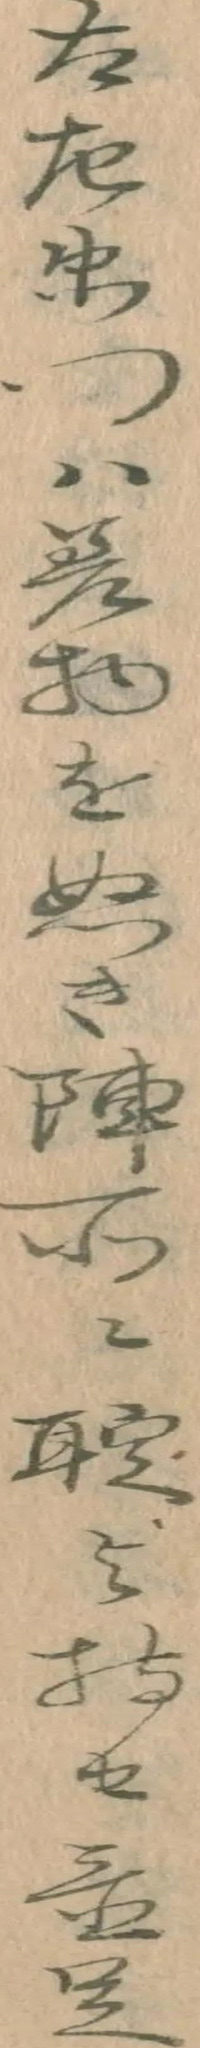太左衛門は差物を怒き陣所に聢与持せ置足
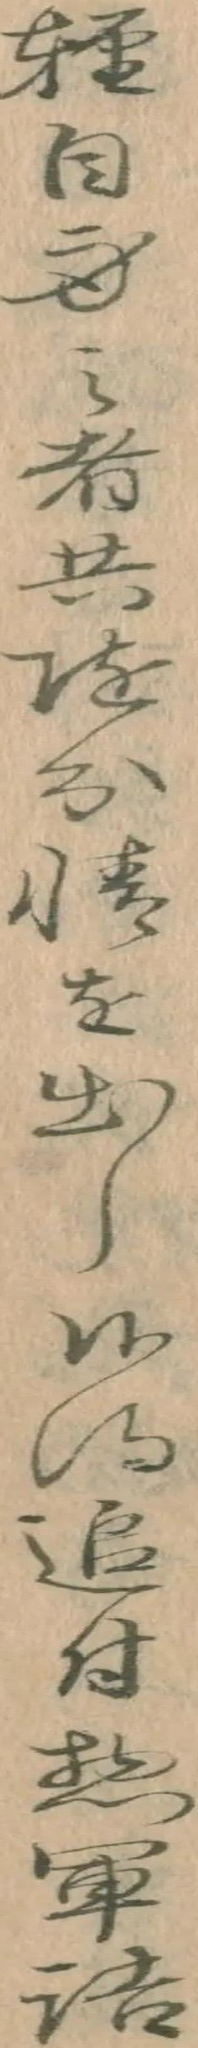軽自身之者共随分情を出し候得追付惣軍詰
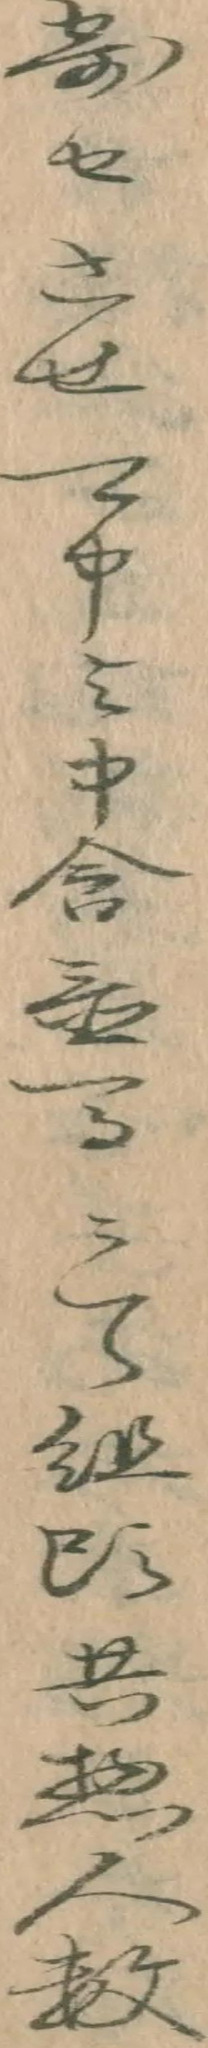寄せさせ可申与申含置馬にて組頭共惣人数
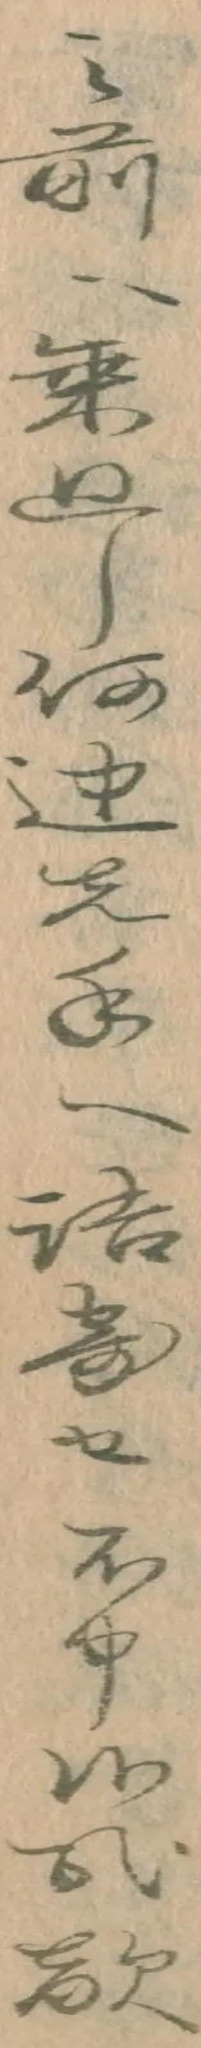之前へ乗廻し何迚先手へ詰寄せ不申候哉敵
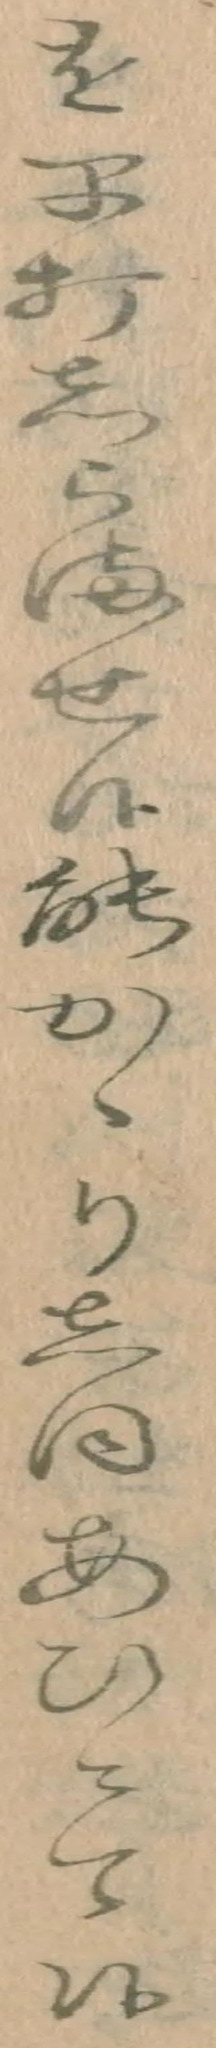を早打志ら満せ候能かゝり志同あひにて候
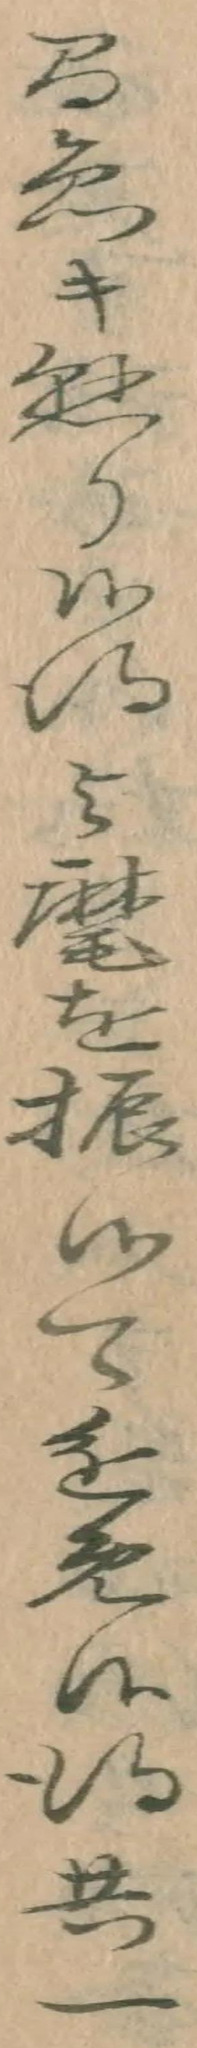間急き懸り候得与麾を振候て進免候得共一
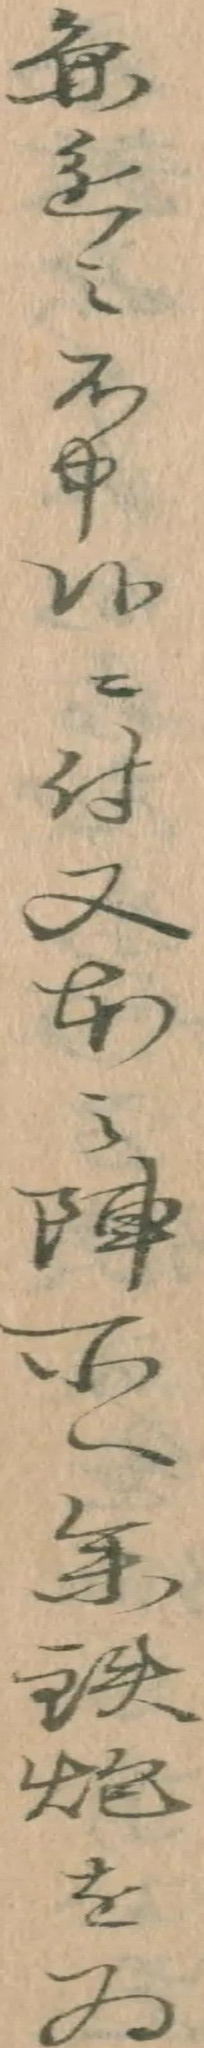円進み不申候に付又本之陣所へ参鉄炮をゐ
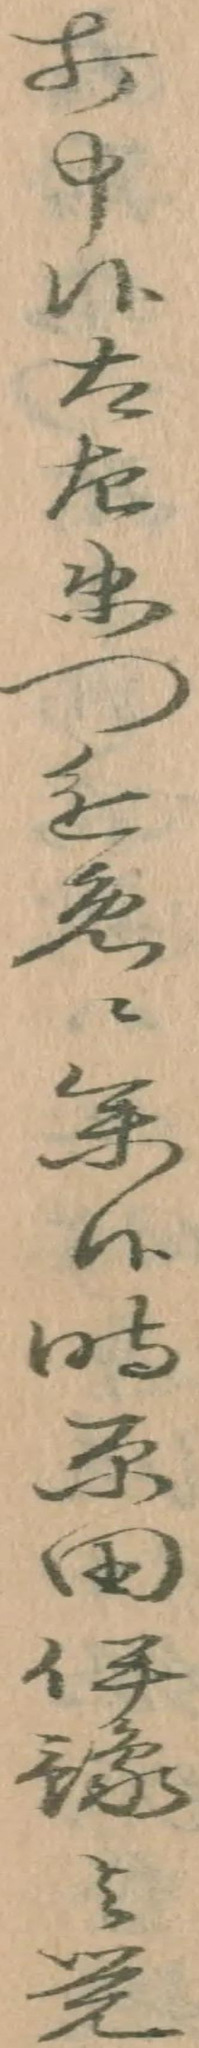打申候太左衛門進免に参候時原田伊予与覚
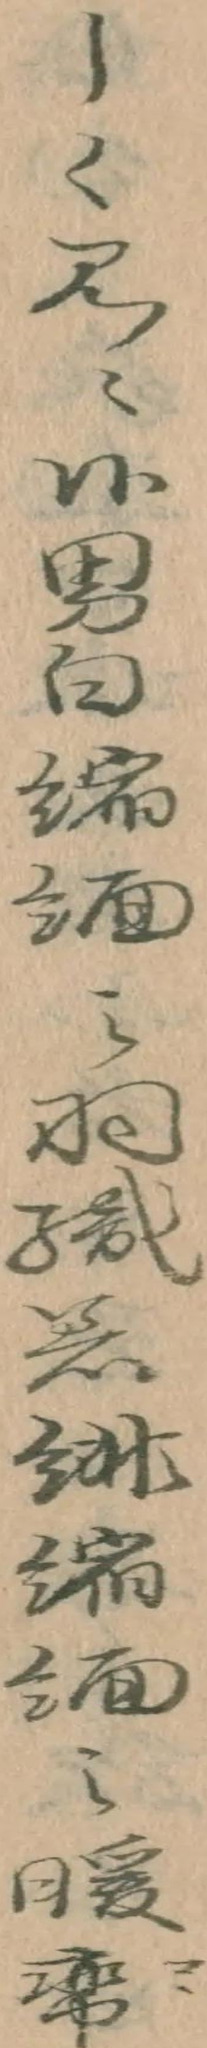しく見に候男白縮緬之羽織着緋縮緬之暖帟
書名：切支丹御退治記 49巻. [2]
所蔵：国立国会図書館 National Diet Library, JAPAN
